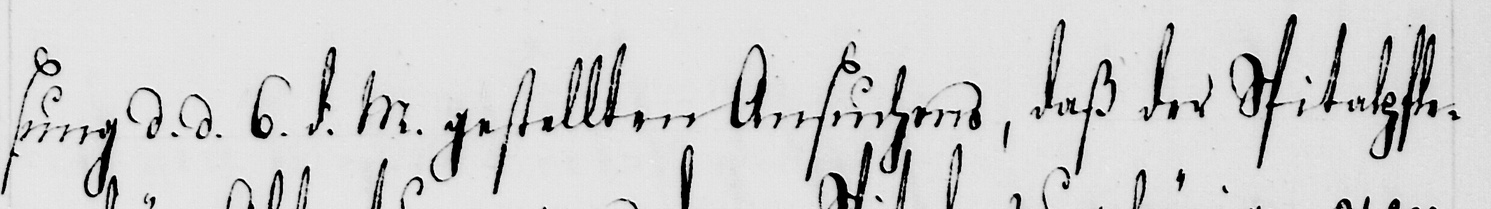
ng d. d. 6. d. M. gestellten Ansuchens, daß der Spitalpfle¬
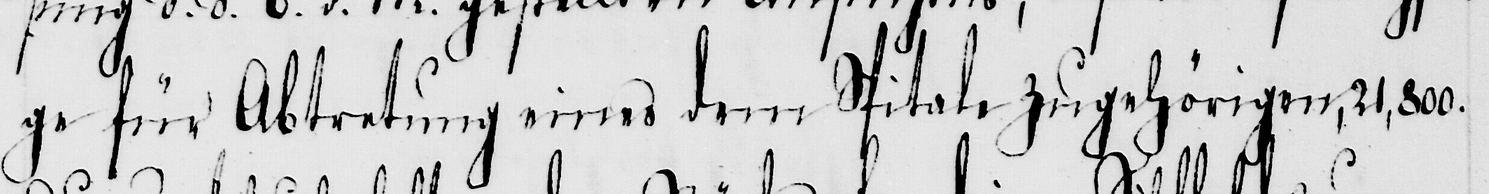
ge für Abtretung eines dem Spitale zugehörigen, 21,800.
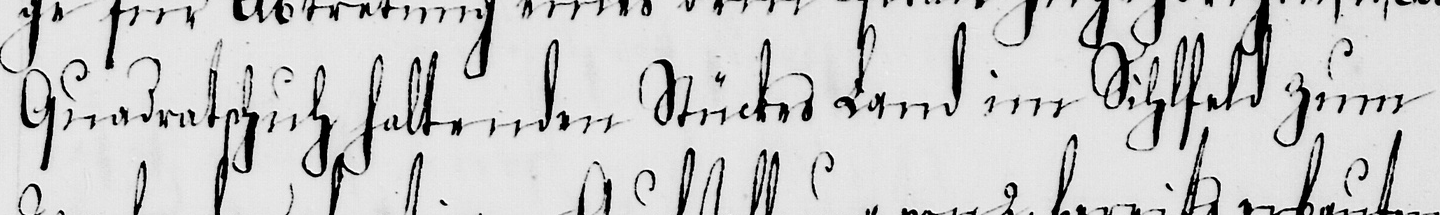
Quadratschuh haltenden Stückes Land im Sihlfeld zum
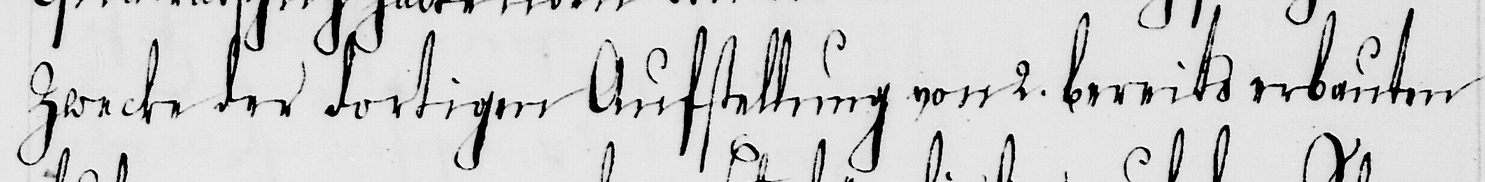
Zwecke der dortigen Aufstellung von 2. bereits erbauten
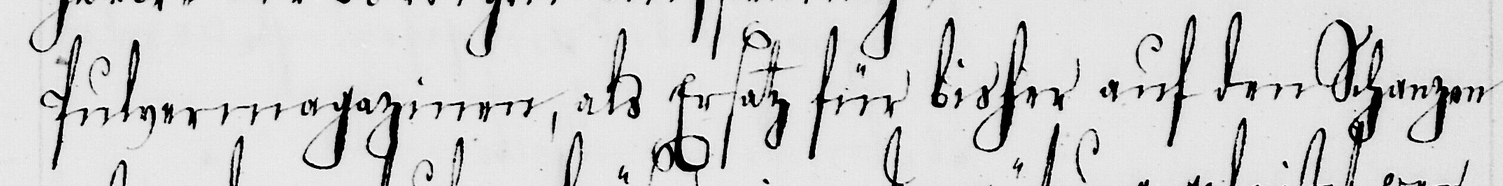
Pulvermagazinen, als Ersatz für bisher auf den Schanzen
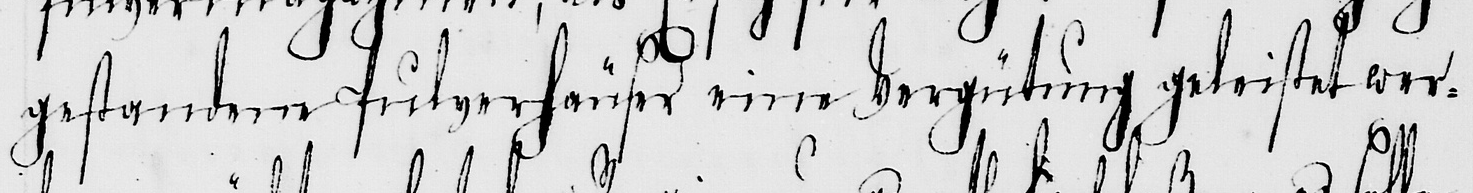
gestandene Pulverhäuser eine Vergütung geleistet wer¬
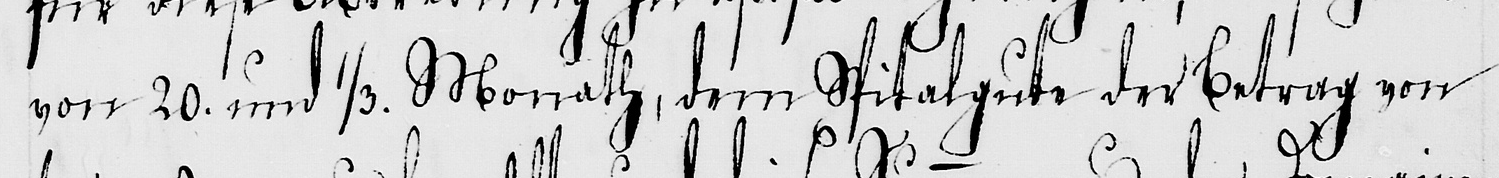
von 20. und 1/3. Monath, dem Spitalgute der Betrag von
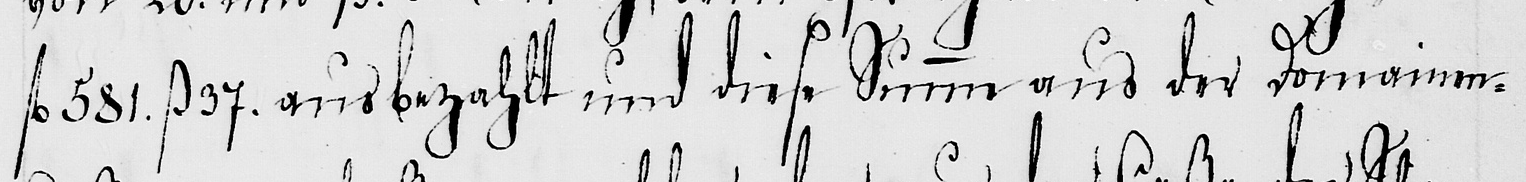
fl. 581. ß 37. ausbezahlt und diese Summe aus der Domaine¬
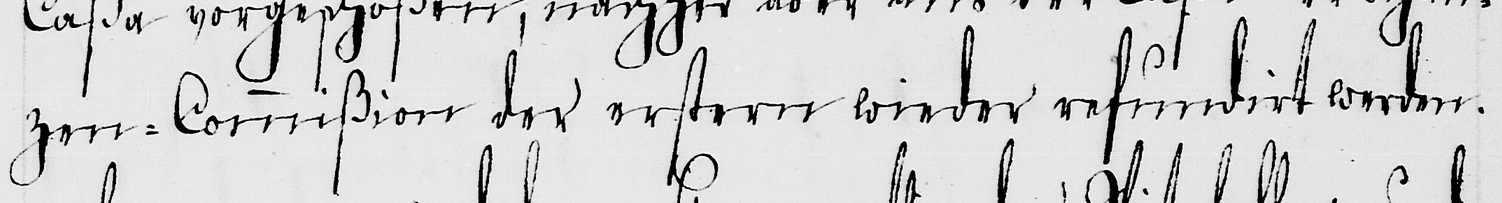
zen-Commißion der erstern wieder refundirt werden.
